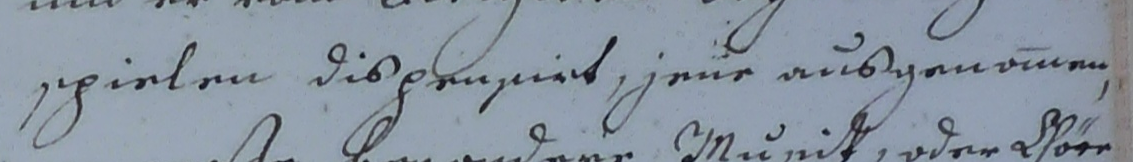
spielen dispensirt , jene ausgenom̅en
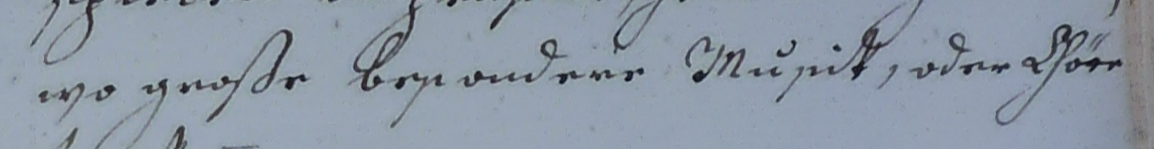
wo große besondere Musik, oder Chöre
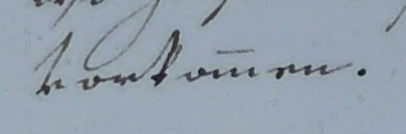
vorkom̅en.
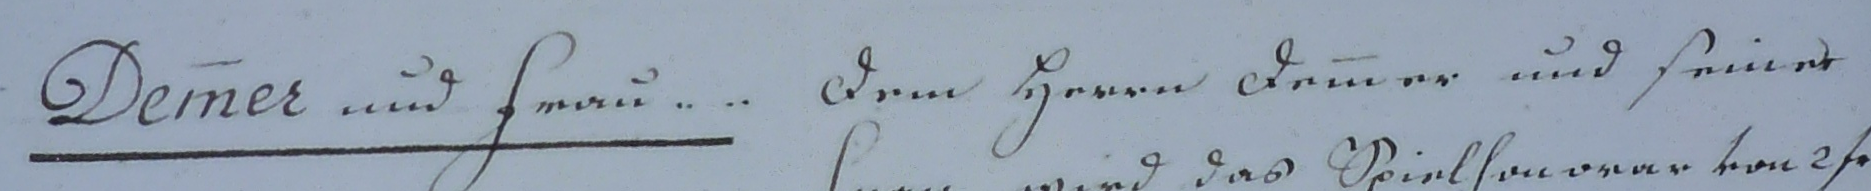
Dem̅er und Frau .. .. Dem Herrn Dem̅er und seiner
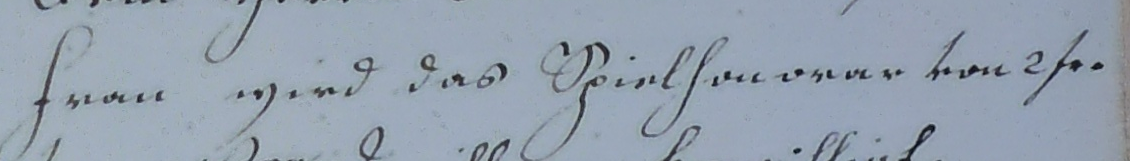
Frau wird das Spielhonorar von 2fr.
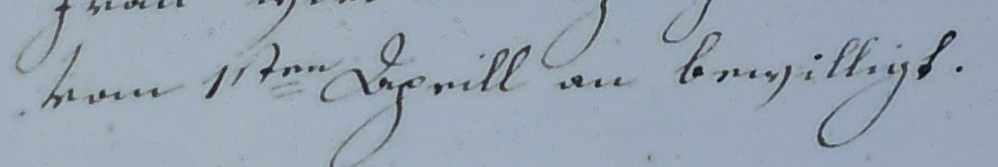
vom 1ste͇n Aprill an bewilligt.
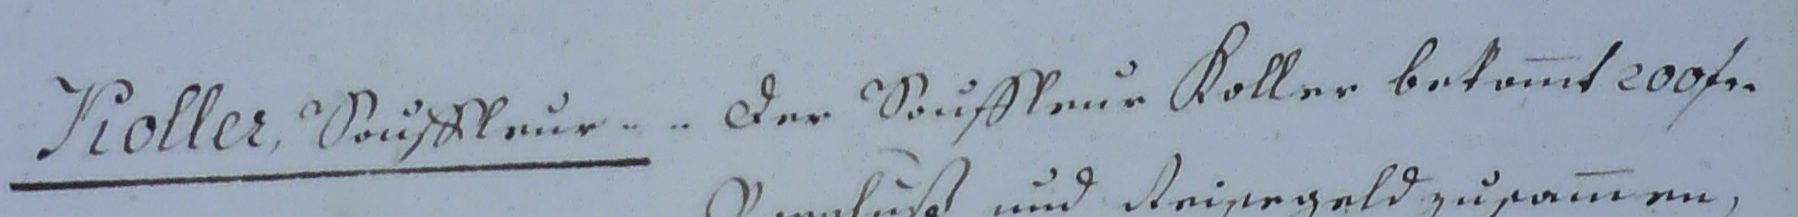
Koller, Souffleur .. .. Der Souffleur Koller bekom̅t 200fr.
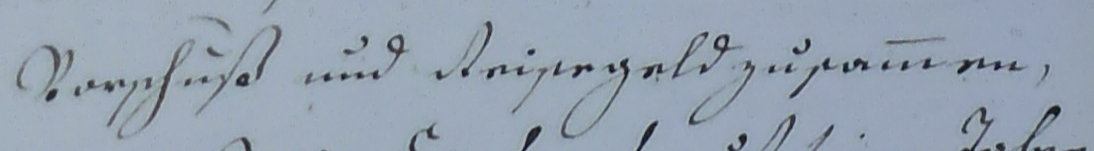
Vorschuß und Reisegeld zusam̅en,
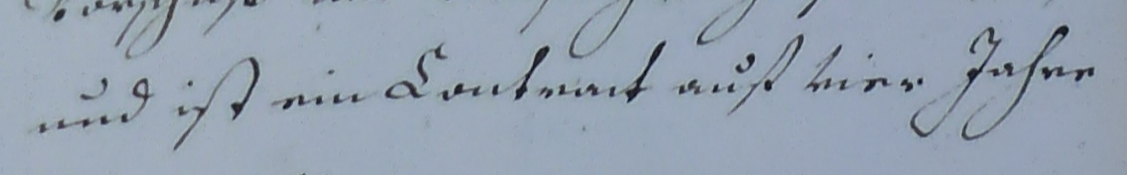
und ist ein Contract auf vier Jahre
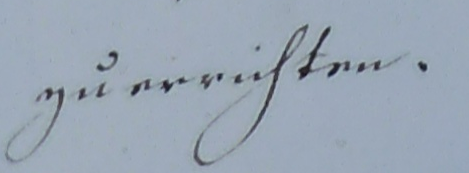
zu errichten.
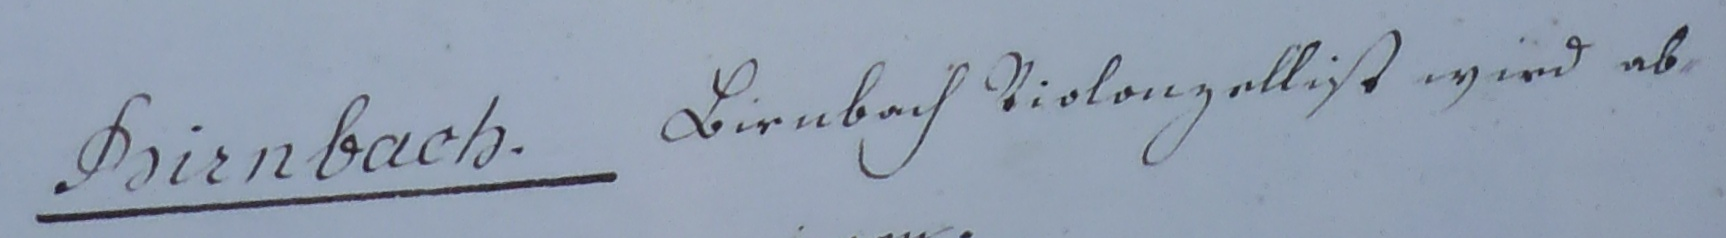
Birnbach. Birnbach Violonzellist wird ab¬
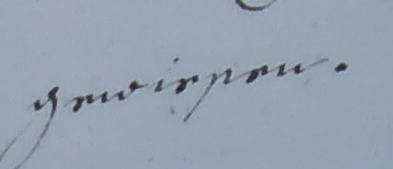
gewiesen.
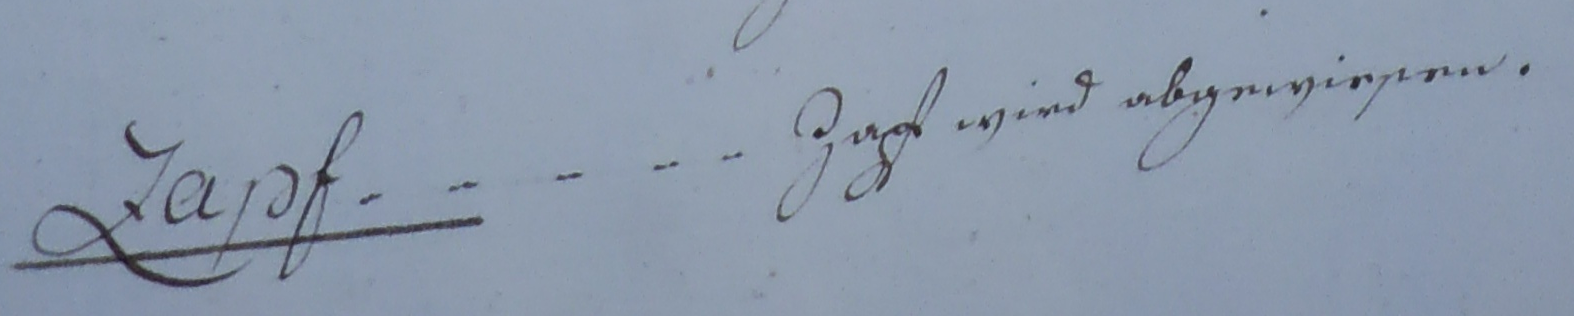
Zapf .. .. .. .. .. Zapf wird abgewiesen.
